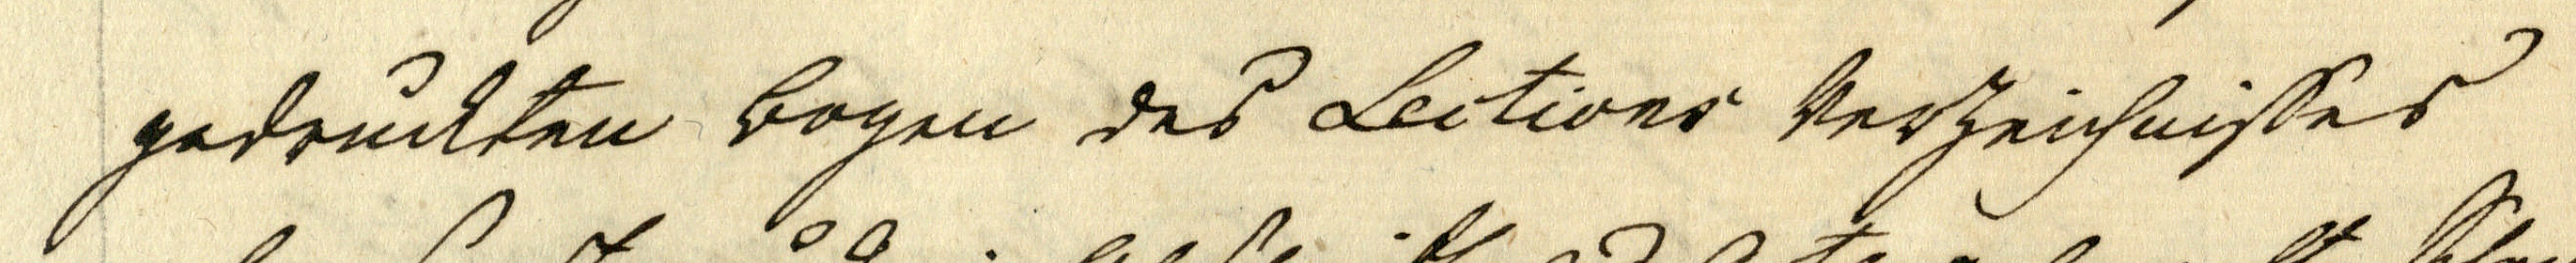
gedruckten Bogen des Lections Verzeichnisses
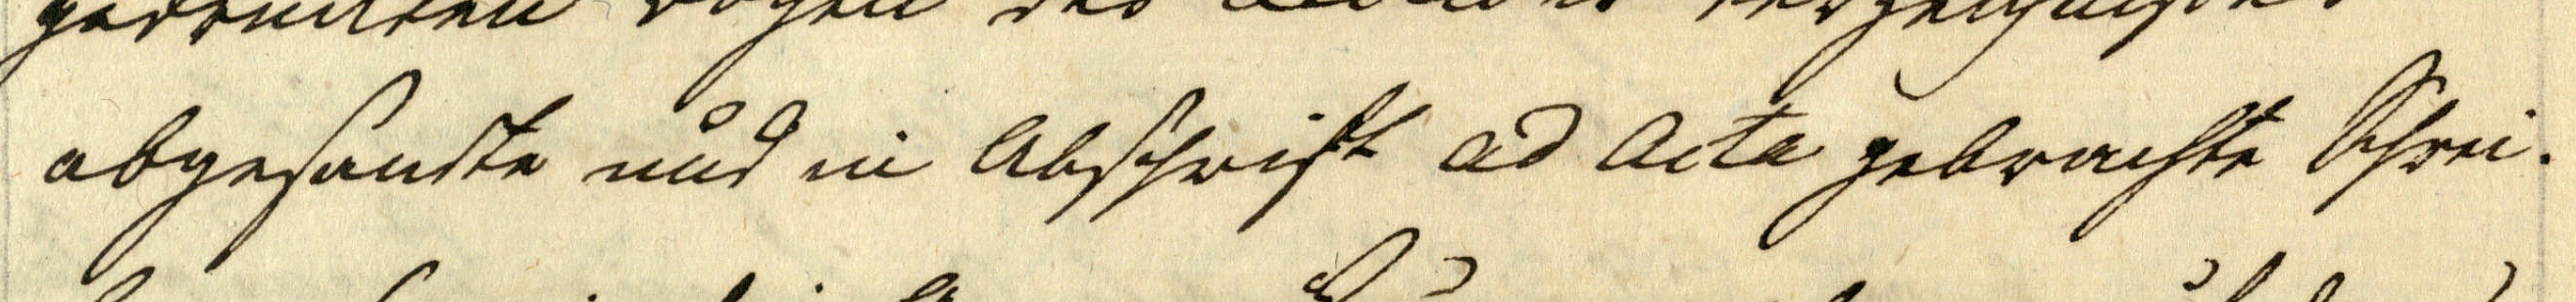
abgesandte und in Abschrift ad Acta gebrachte Schrei¬
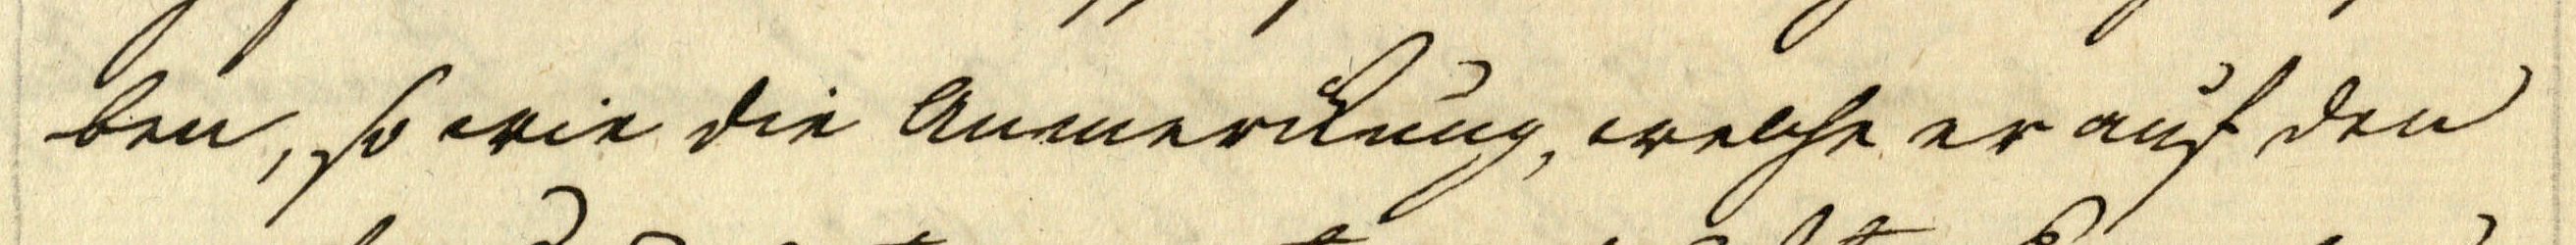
ben, so wie die Ammerckung, welche er auf den
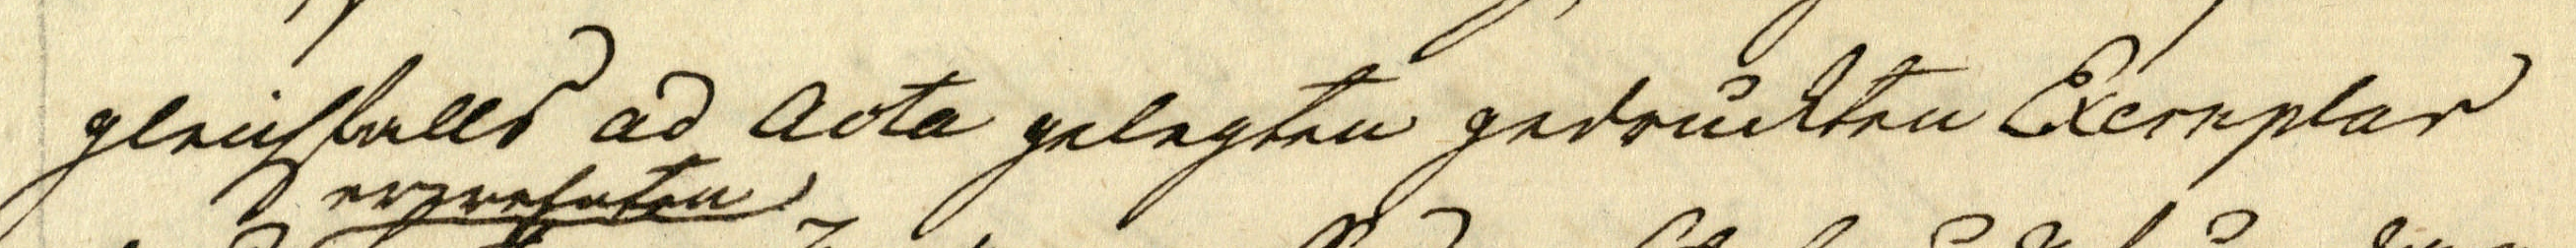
gleichfalls ad Acta gelegten gedruckten Exemplar
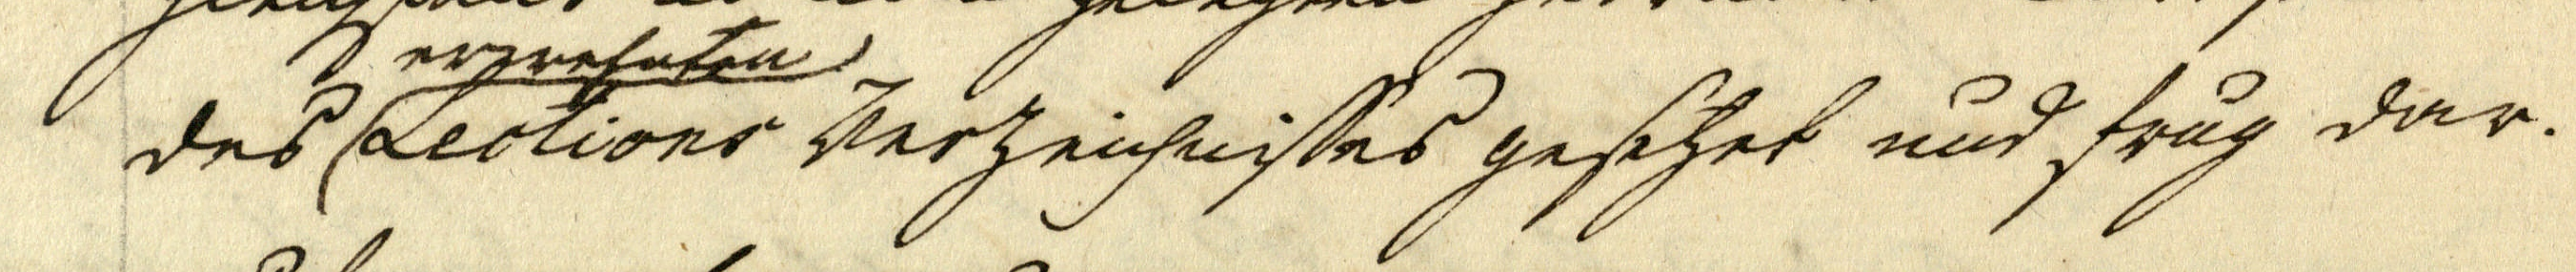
des erwehnten Lections Verzeichnisses gesetzet und frug dar¬
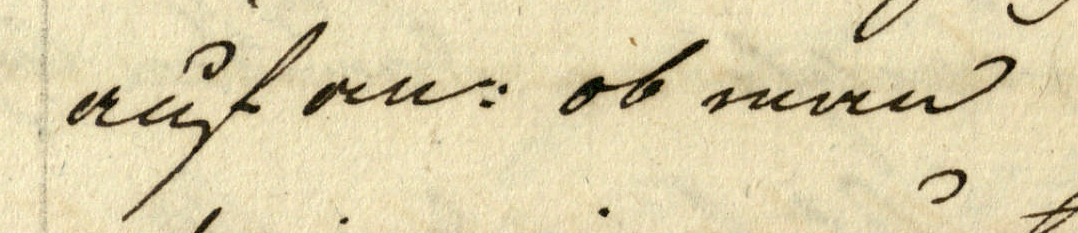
auf an: ob man
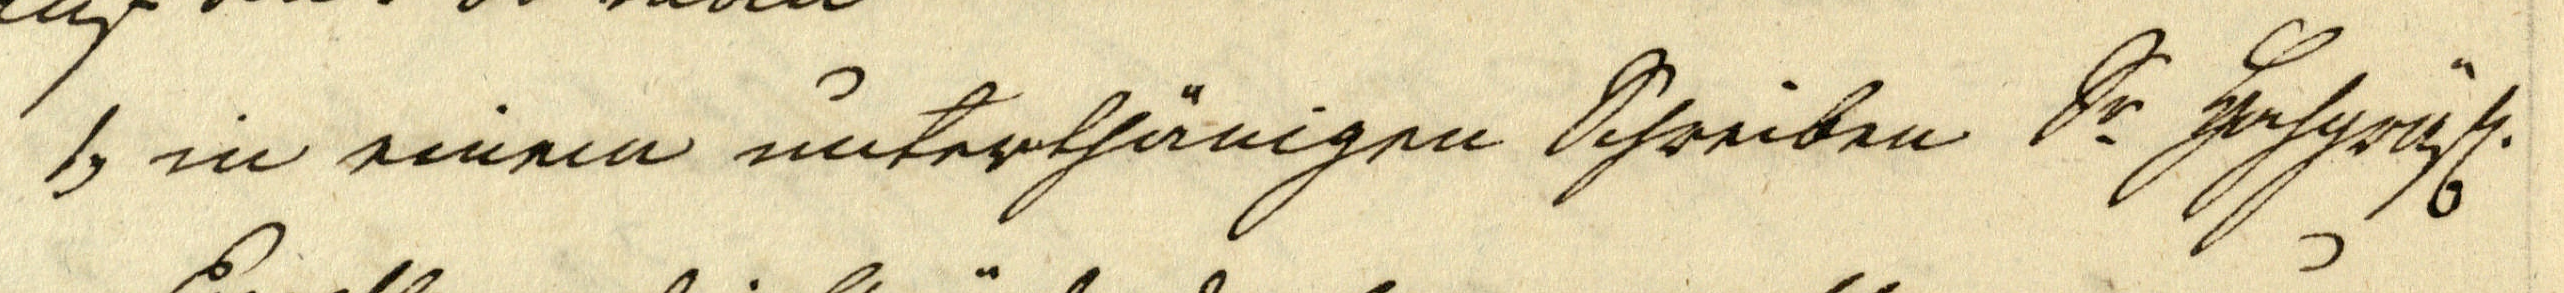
1., in einem unterthänigen Schreiben Sr Hochgräfl.
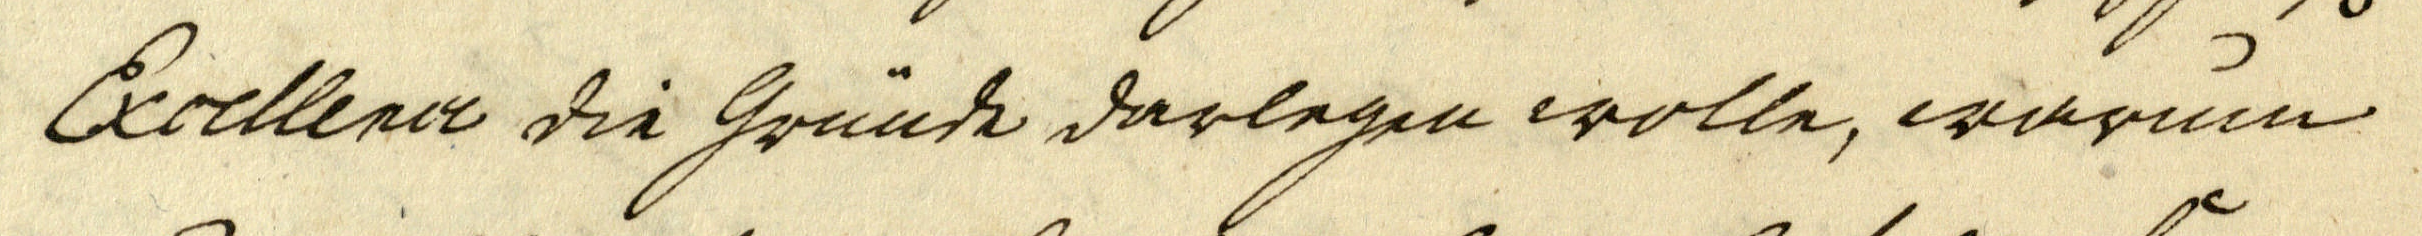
Excellence die Gründe darlegen wolle, warum
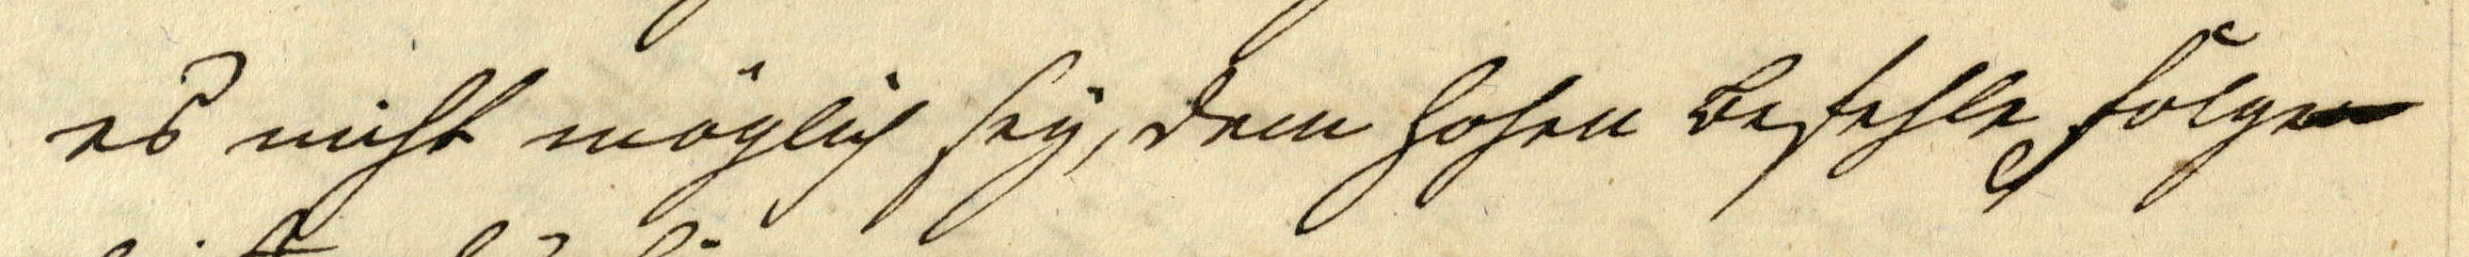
es nicht möglich seÿ, dem hohen Befehle Folge
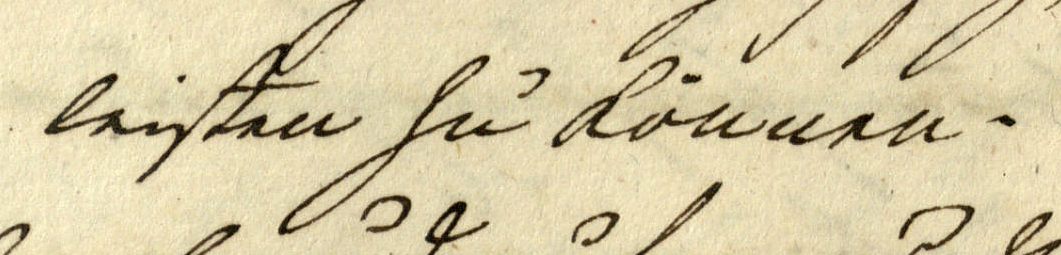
leisten zu können.
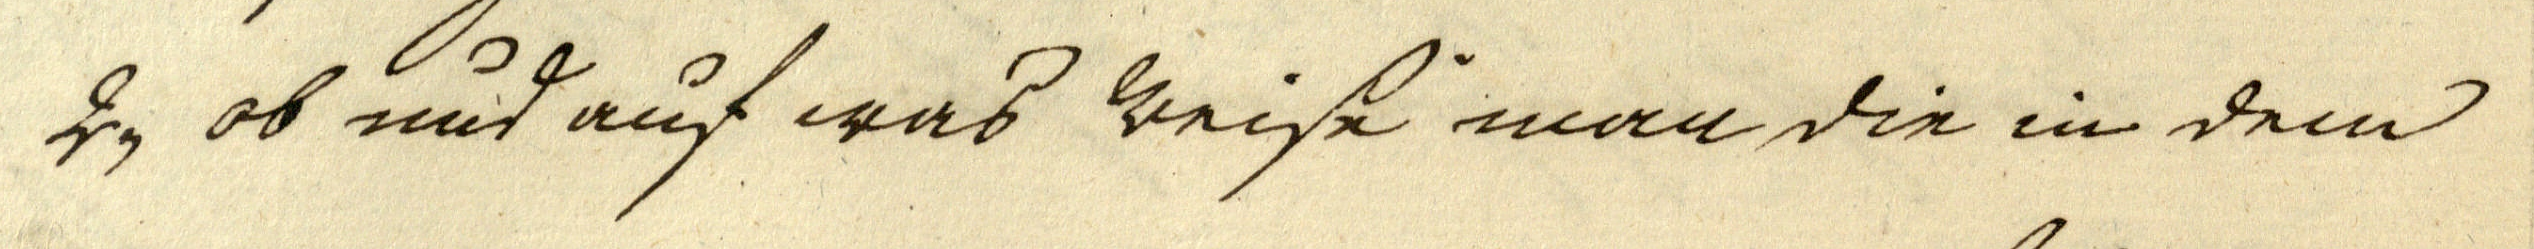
2., ob und auf was Weise man die in dem
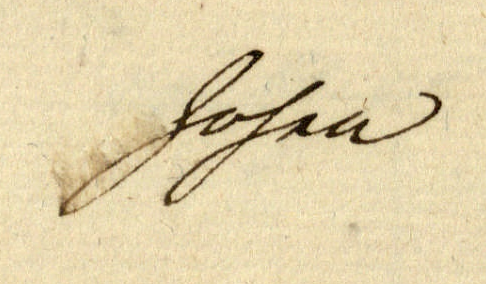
hohen
